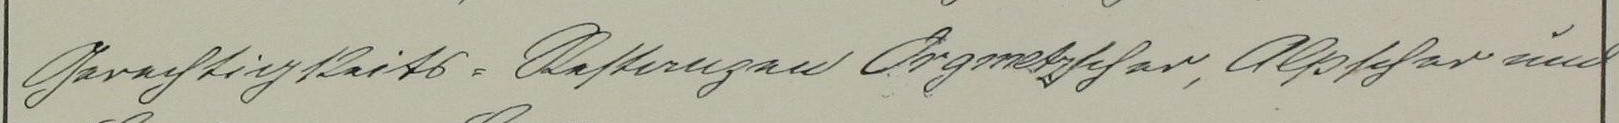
Gerechtigkeits-Restanzen Orgmetzscher, Alpscher und
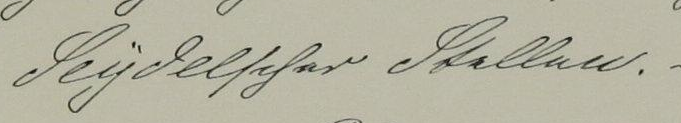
Seydelscher Stellen.
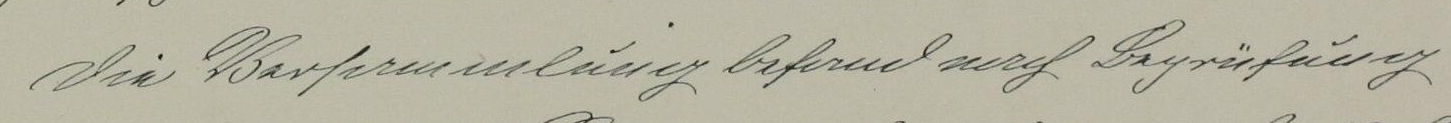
Die Versammlung befand nach Beprüfung
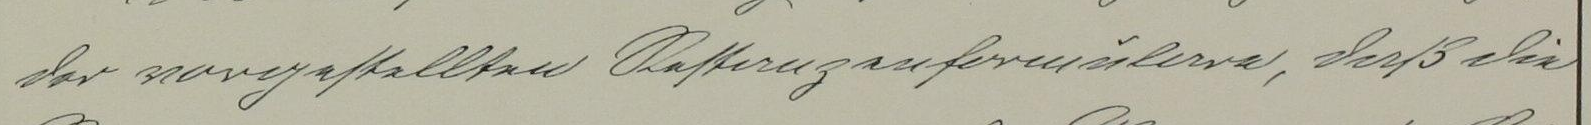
der vorgestellten Restanzenformulare, daß die
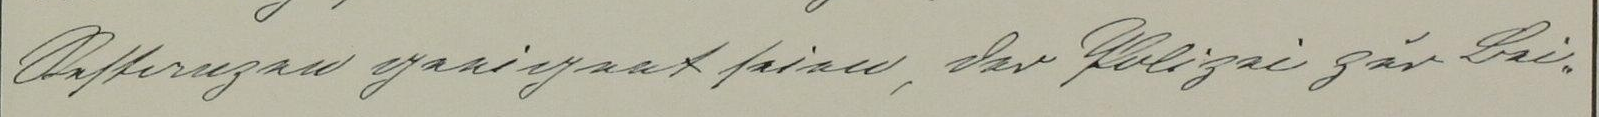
Restanzen geeignet seien, der Polizei zur Bei-
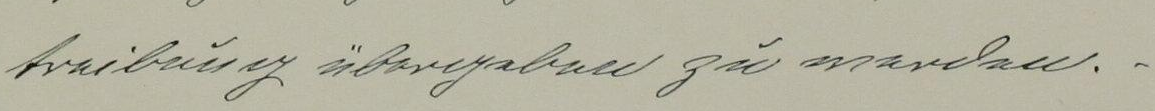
treibung übergeben zu werden.
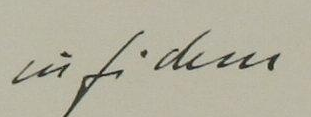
in fidem
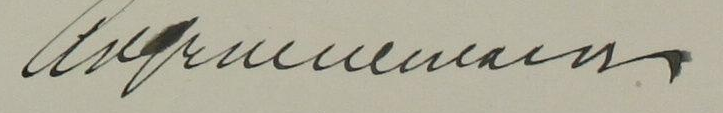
AvGruenewaldt
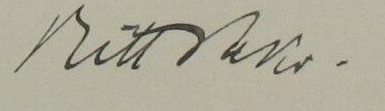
RittSekr.
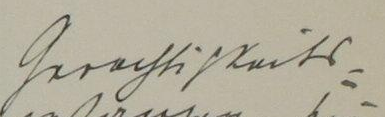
Gerechtigkeits-
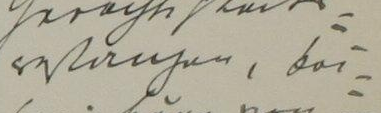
restanzen, bei-
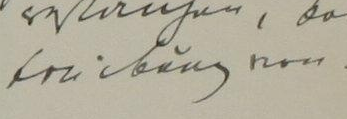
treibung von
